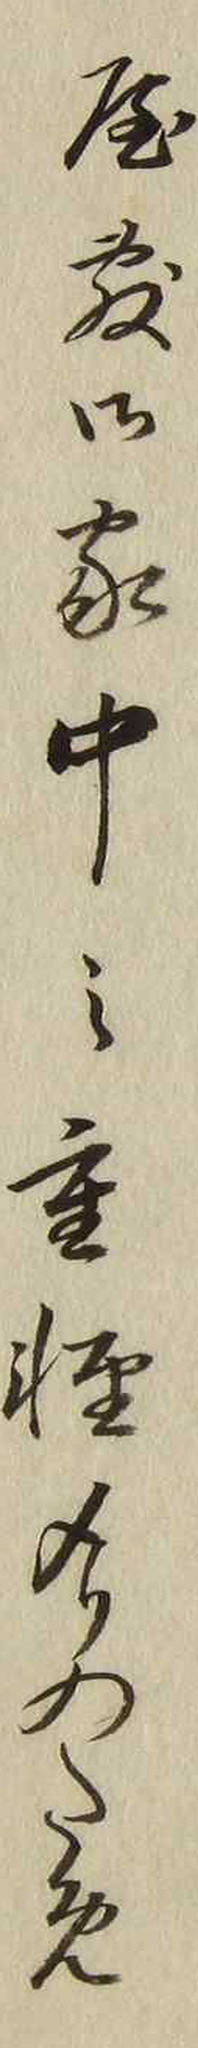屋敷御家中之重軽〆りのため
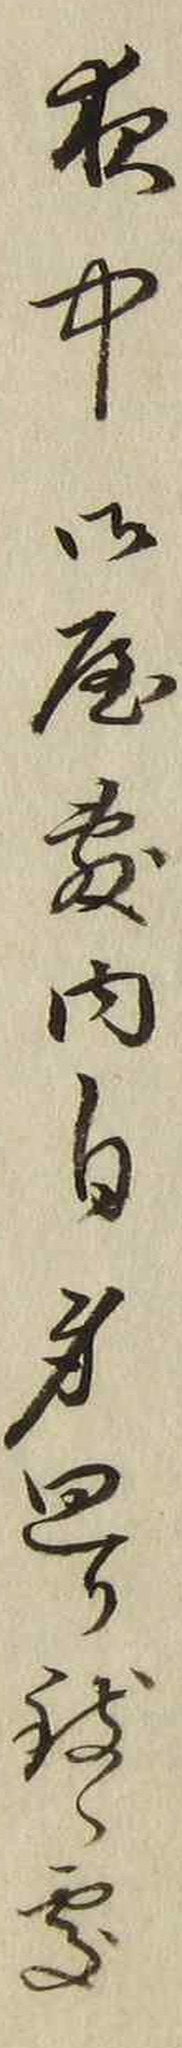夜中御屋敷内自身廻り致候処
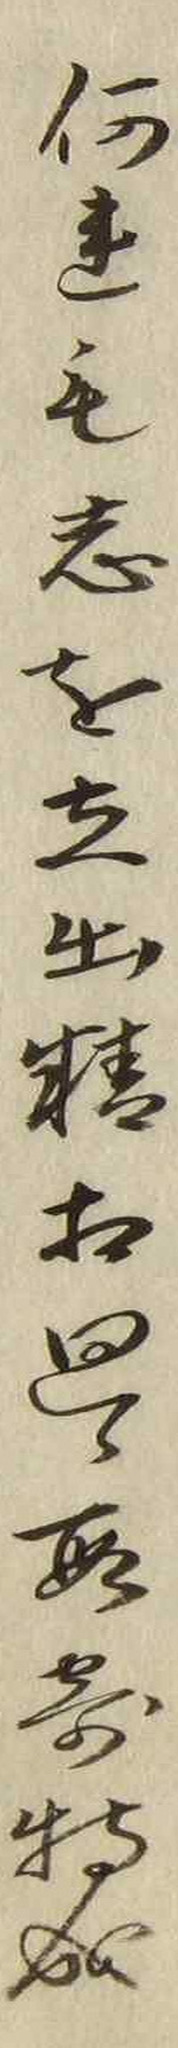何れも志を立出精相廻候段寄特成
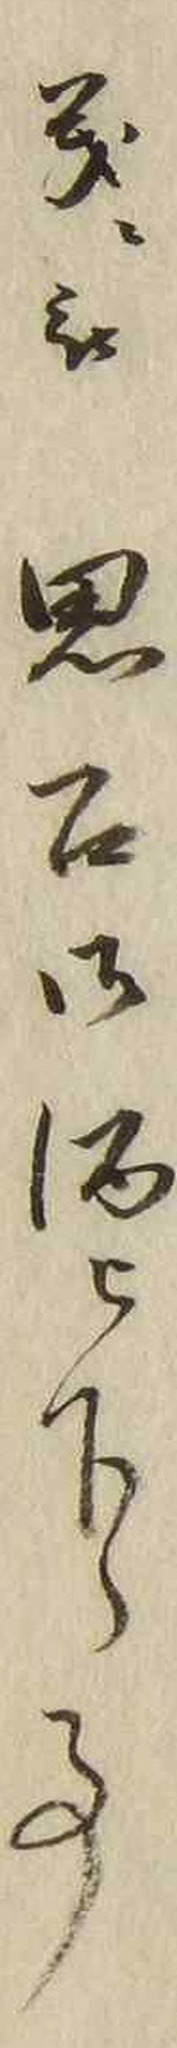義ニ被思召御酒被下候事

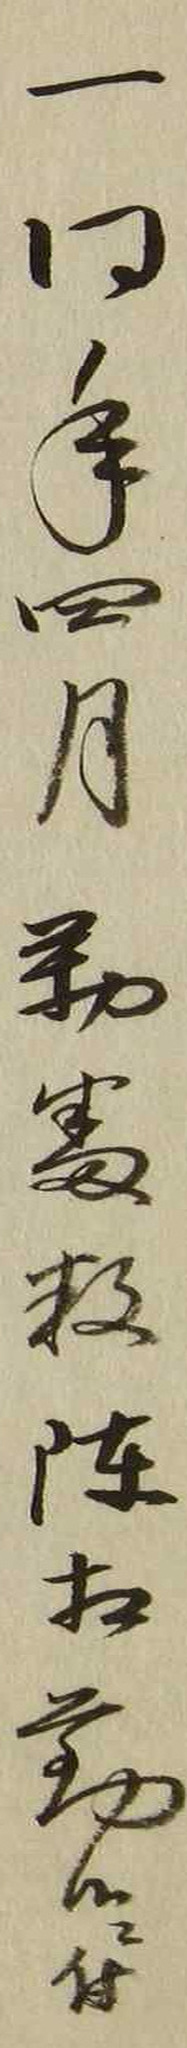一同年四月勤番数陣相勤候ニ付
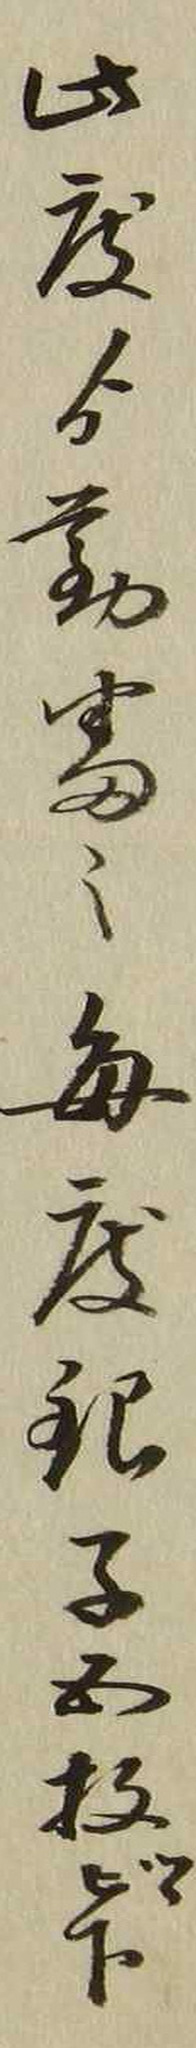此度ゟ勤番之毎度銀子五枚ツヽ被下
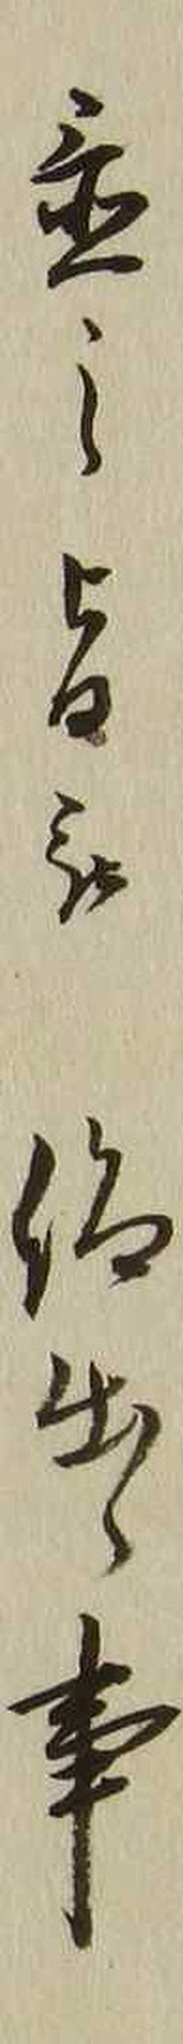置之旨被仰出候事
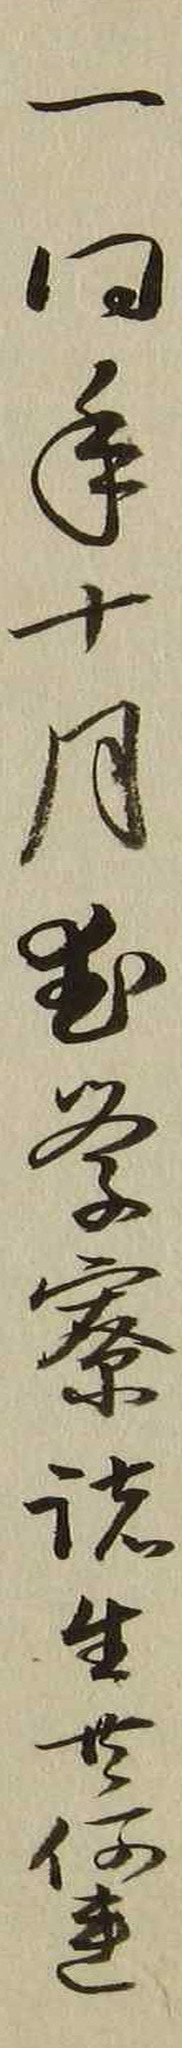一同年十月武学寮諸生共何れ
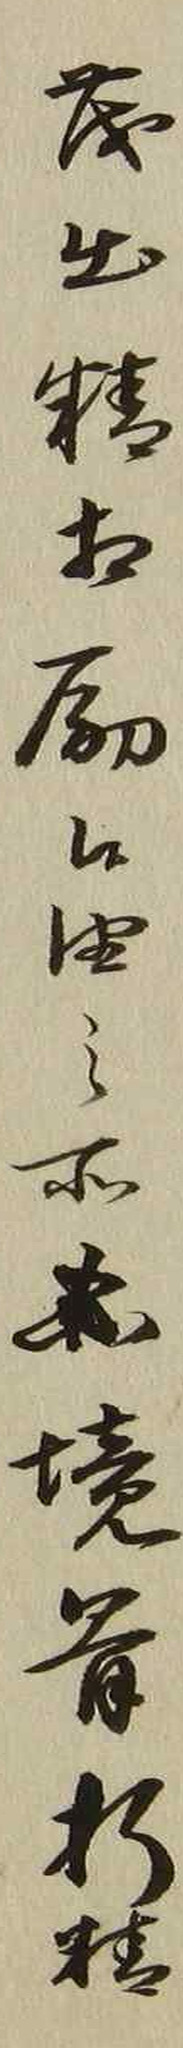も出精相励候由之所も境骨折精
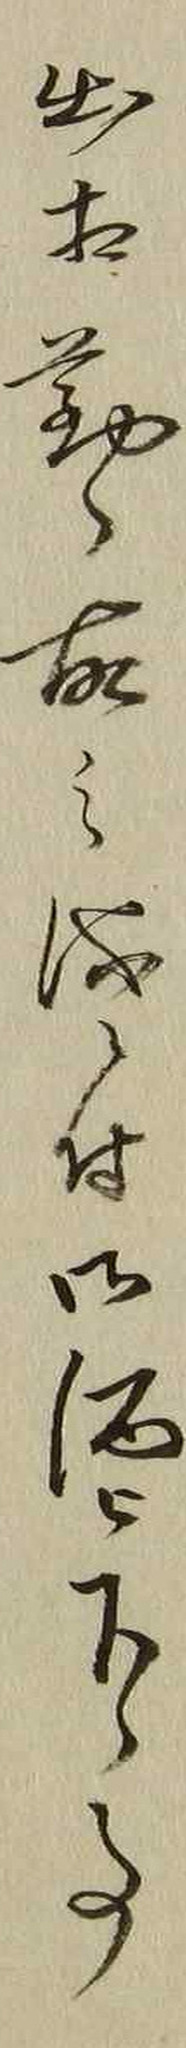出相勤候故之儀ニ付御酒被下候事
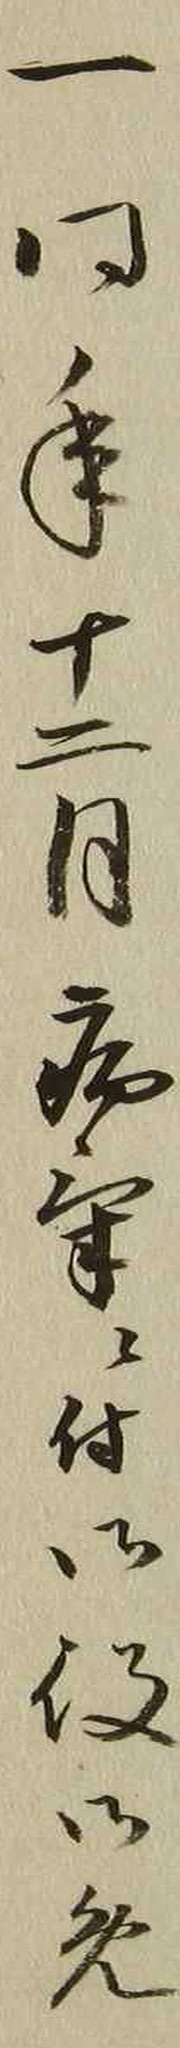一同年十二月病気ニ付御役御免
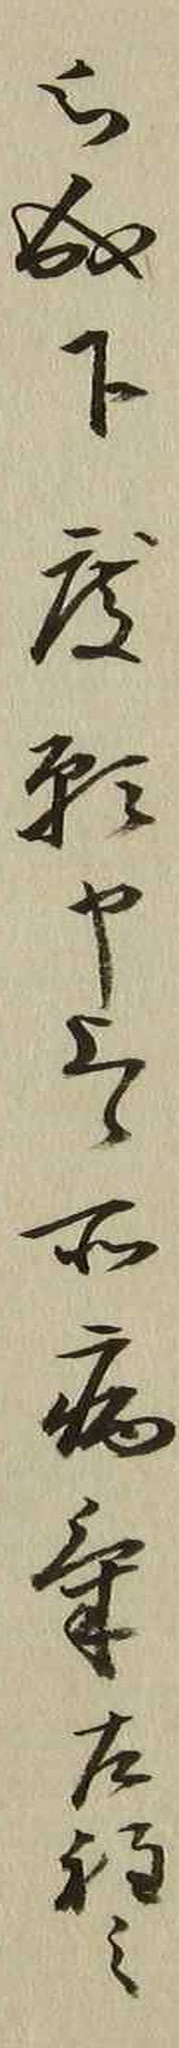被成下度願申上候所病気左程之
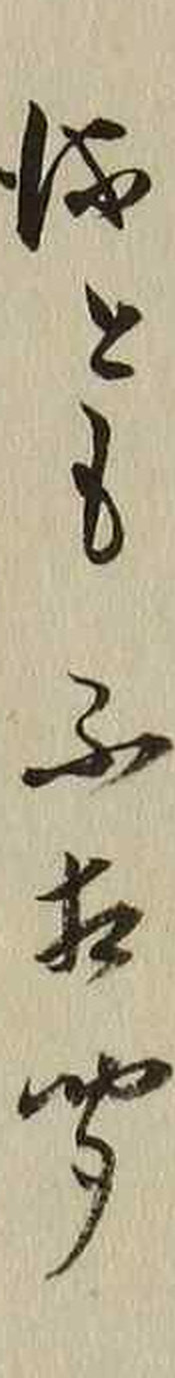儀とも不相聞
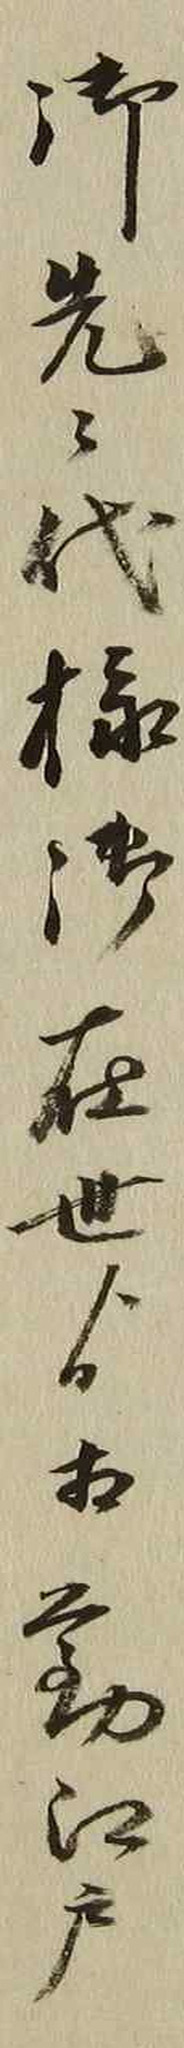御先ニ代様御在世ゟ相勤江戸
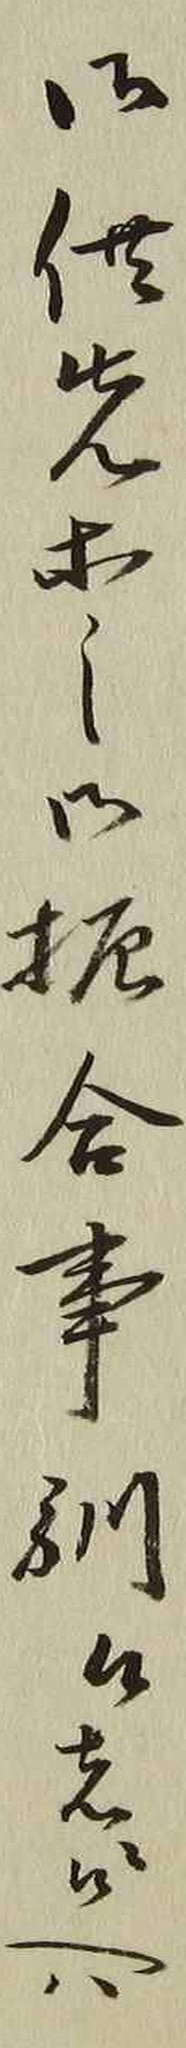御供先等之御振合事馴候者ニ候へハ
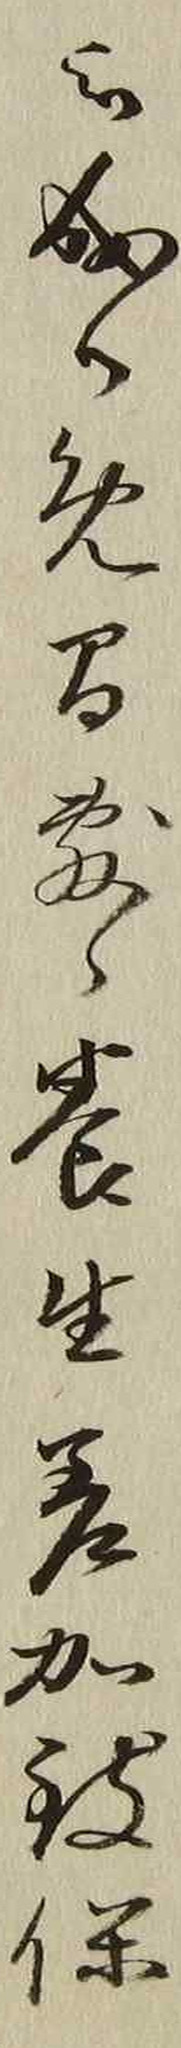被成御免間敷候養生差加致保
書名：諸士系譜　巻之69　を之部3
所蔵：会津若松市立会津図書館
